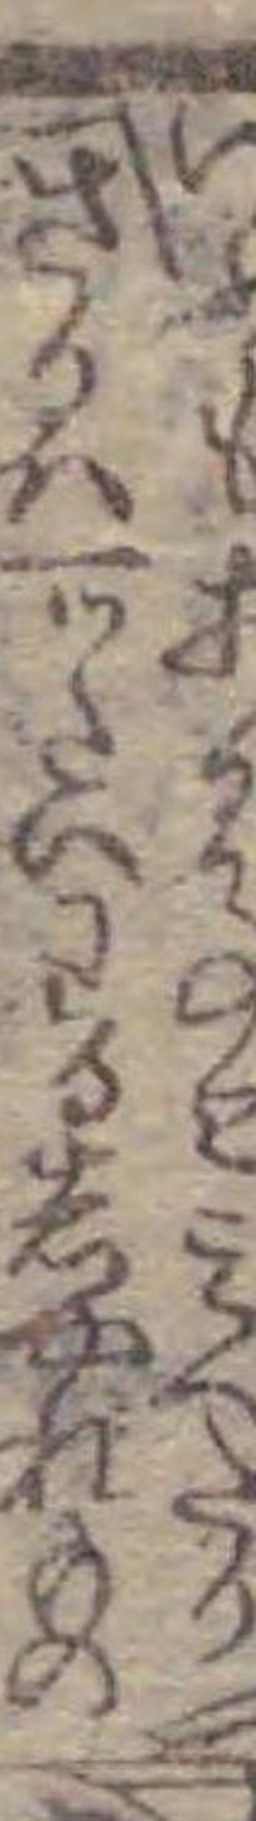〽さるは一
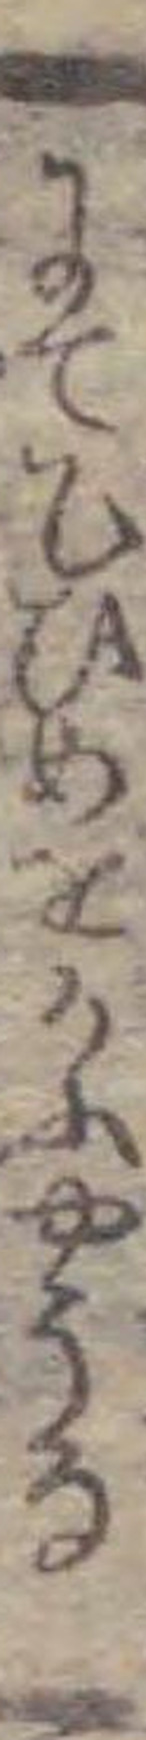にて乙ひめをかふやうな
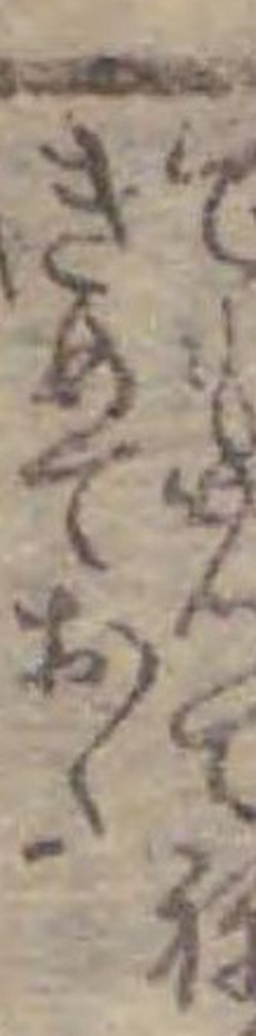きめておく
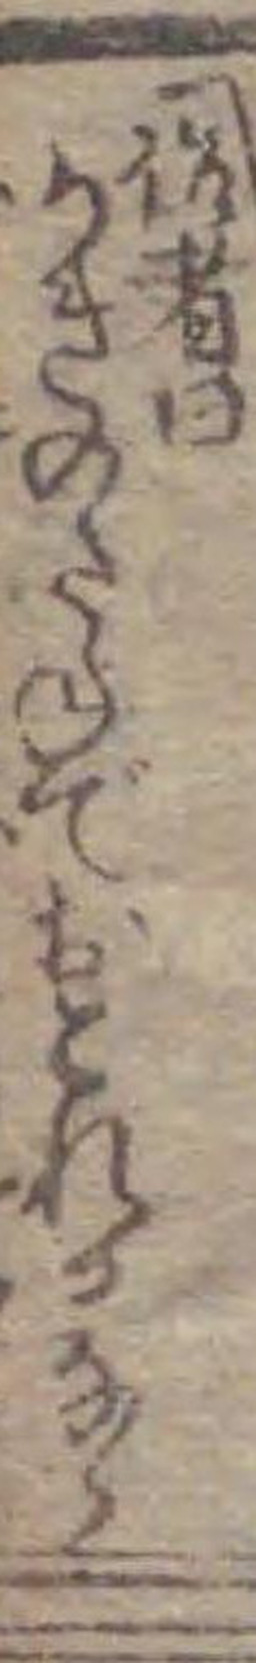かきのたねでおこれるなら

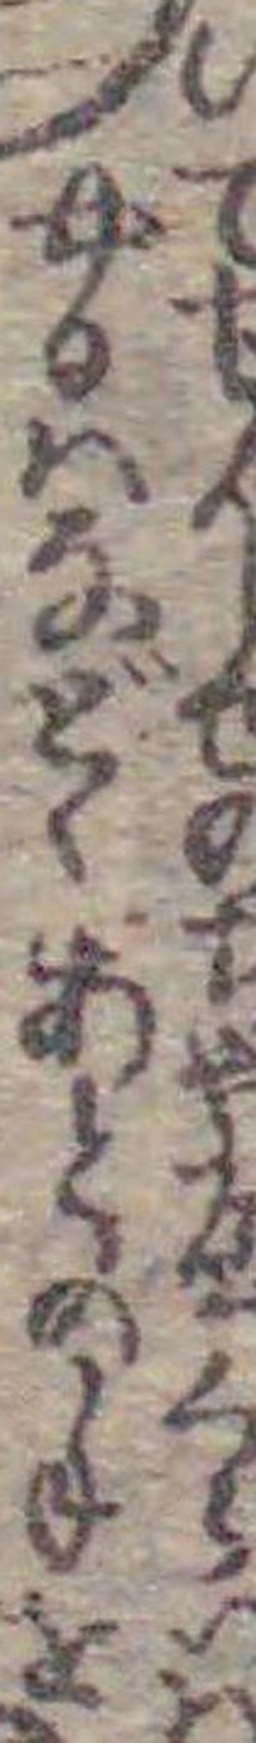やるはなどゝあとの手を引
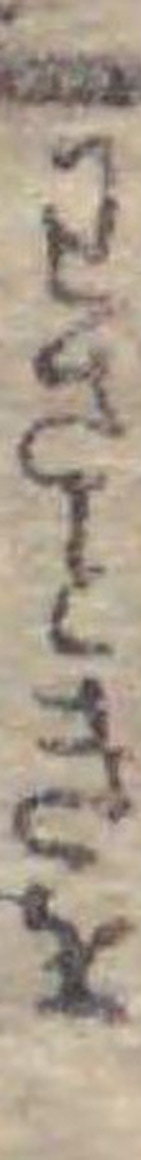わざときを
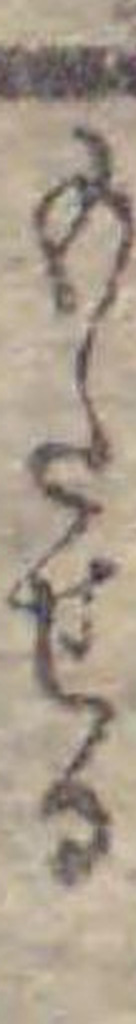もたせる

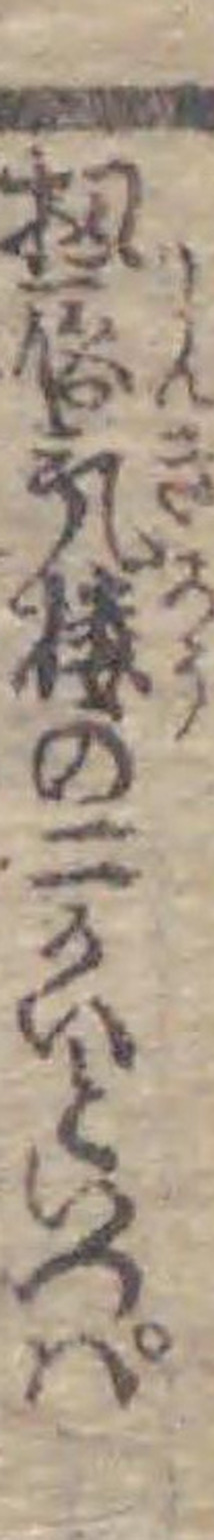扨蜃気楼の二かいといつぱ
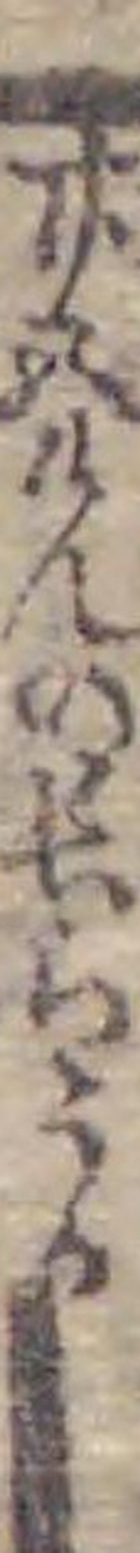廿五けんの長らうより
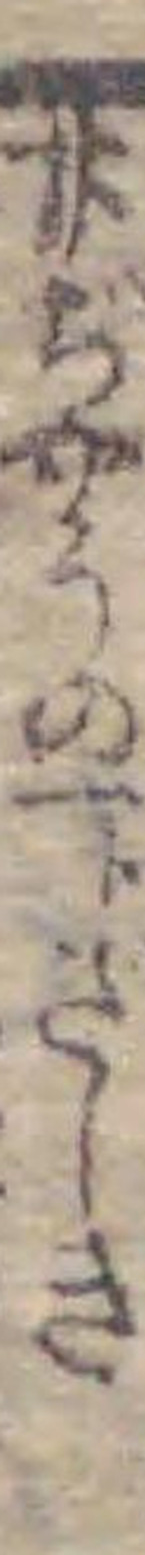廿じやうの一
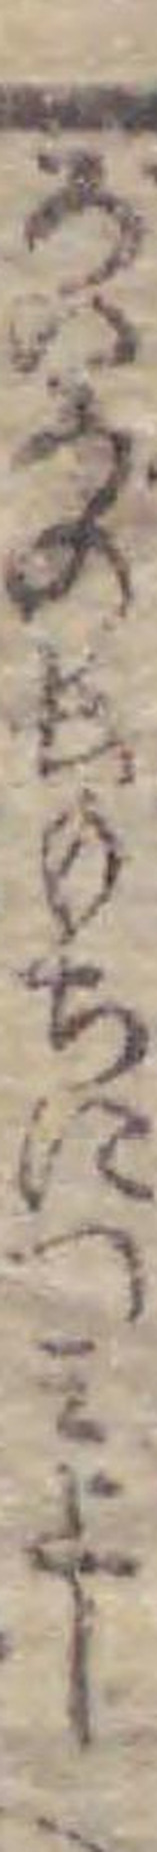ろいろの長もちにつみ上げし
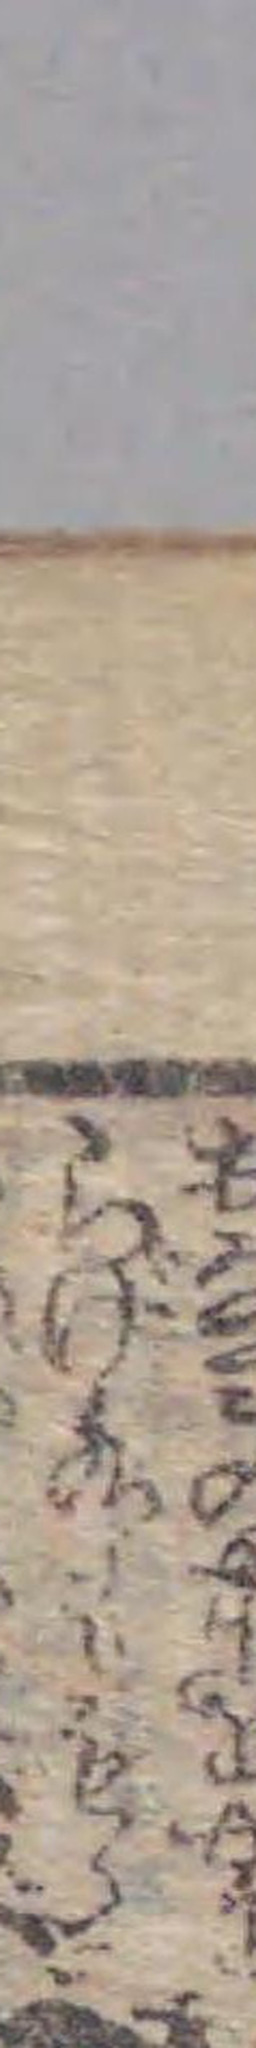らげ水ももら
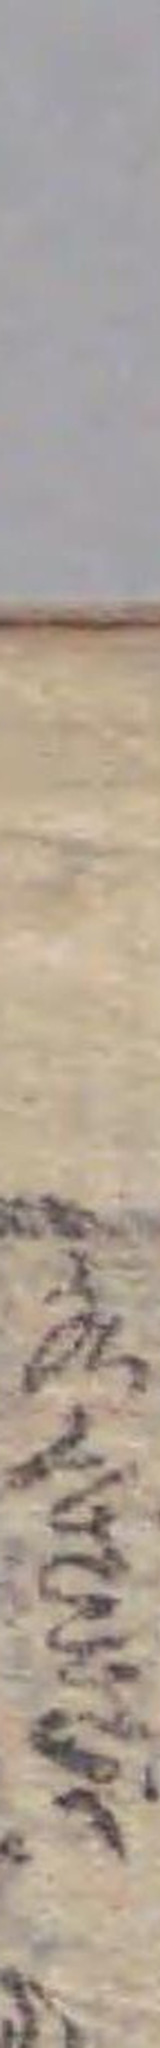水くさき
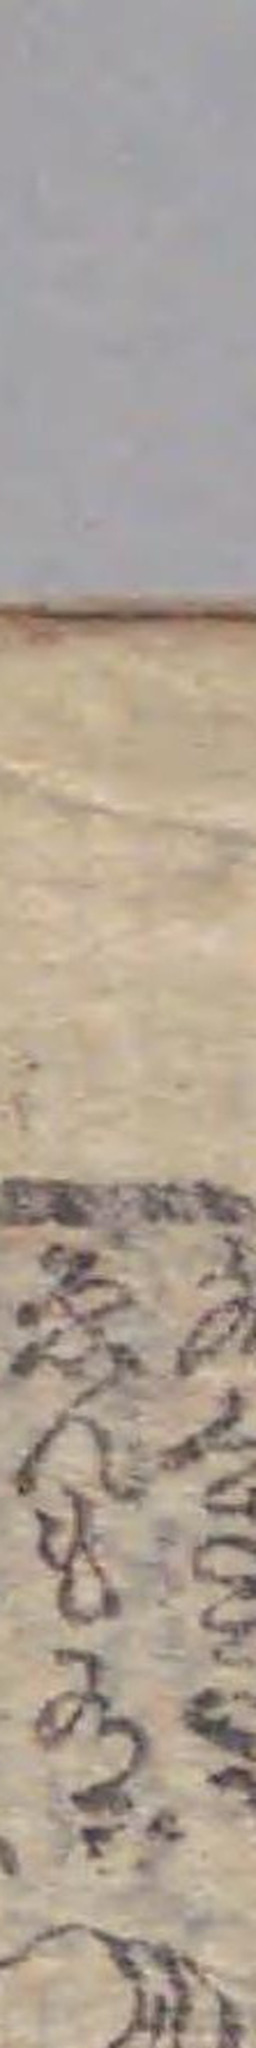ゑんも有
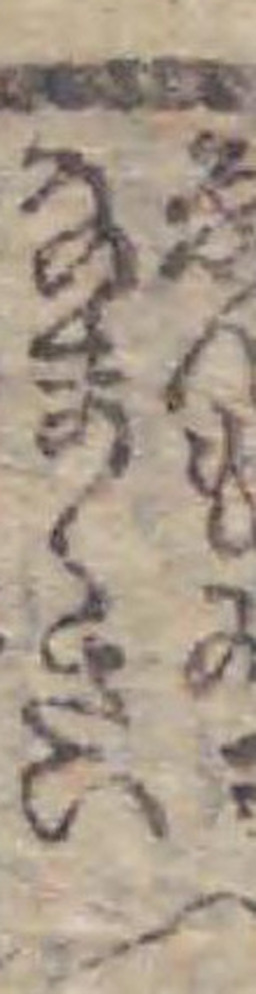なまくさい
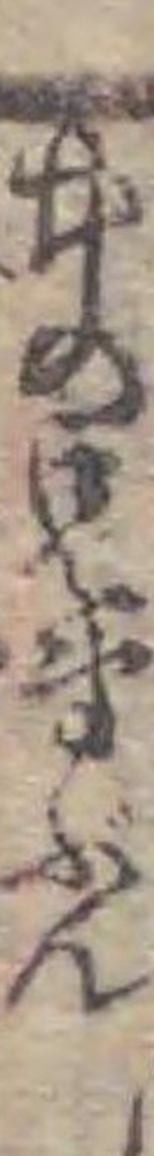中の兄弟ふん
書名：竜宮苦界玉手箱 : 3巻
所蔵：国立国会図書館 National Diet Library, JAPAN
